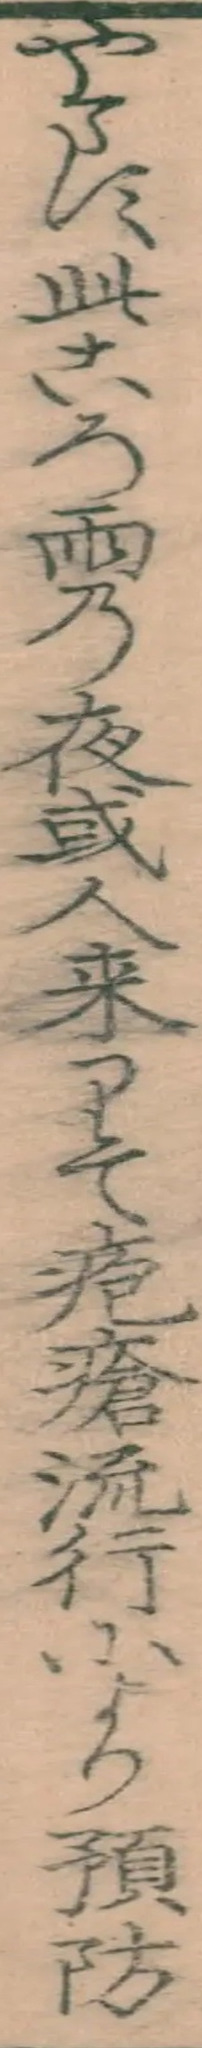やます此ころ雨の夜或人来りて疱瘡流行により預防
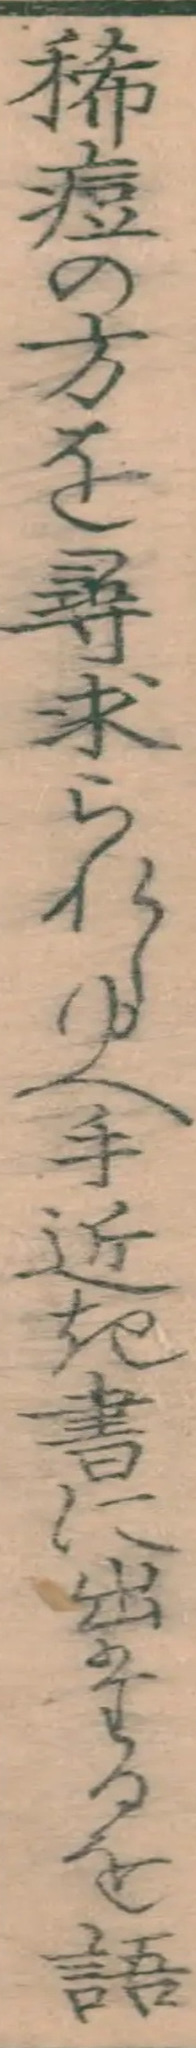稀痘の方を尋求られしゆへ手近き書に出たるを語
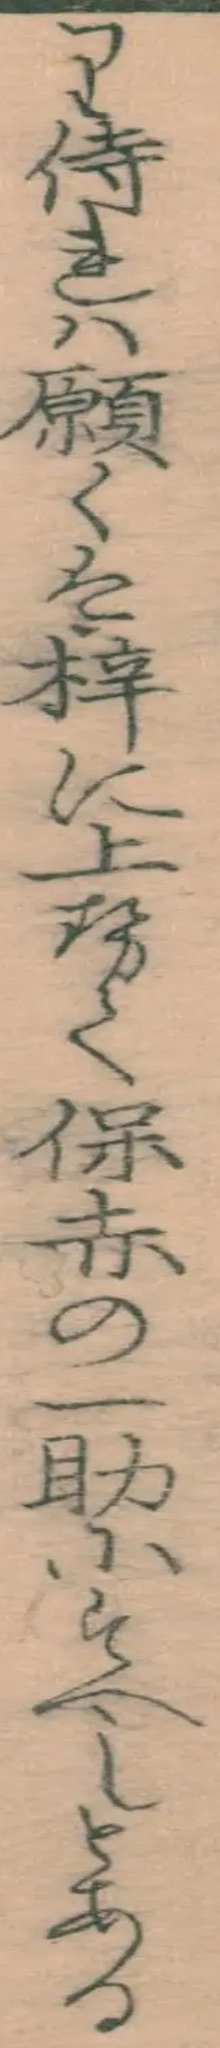り侍れは願くは梓に上せて保赤の一助にそへしとある
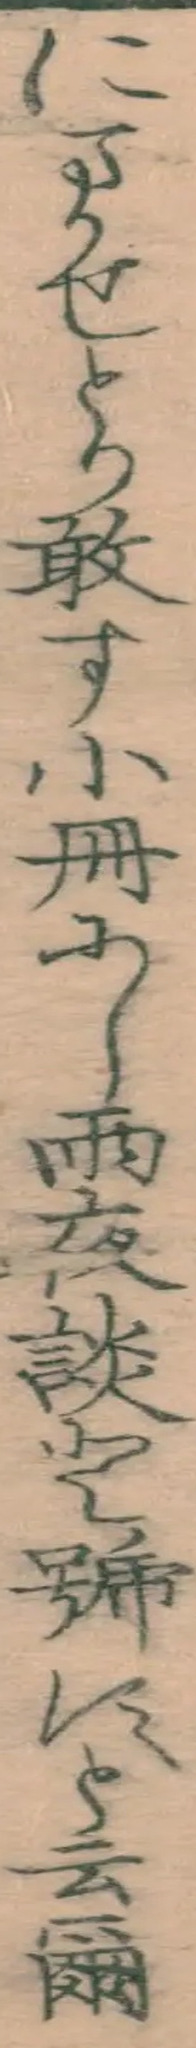にまかせとり敢す小冊にし雨夜談と号すと云爾

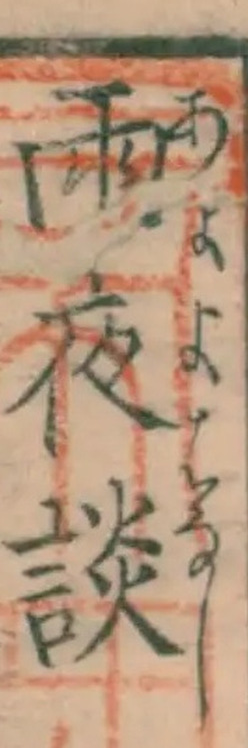雨夜談
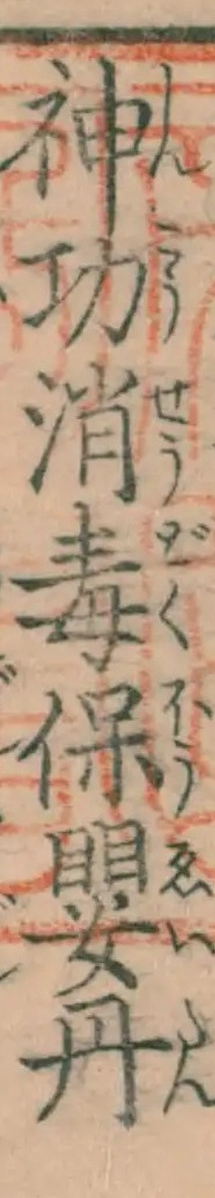神功消毒保嬰丹
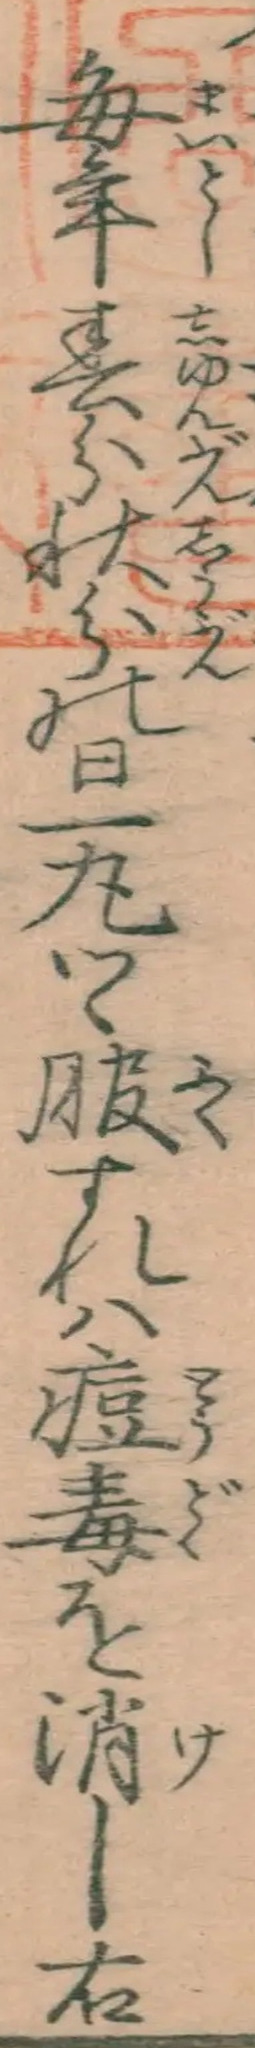毎年春分秋分の日一丸つゝ服すれは痘毒を消し右
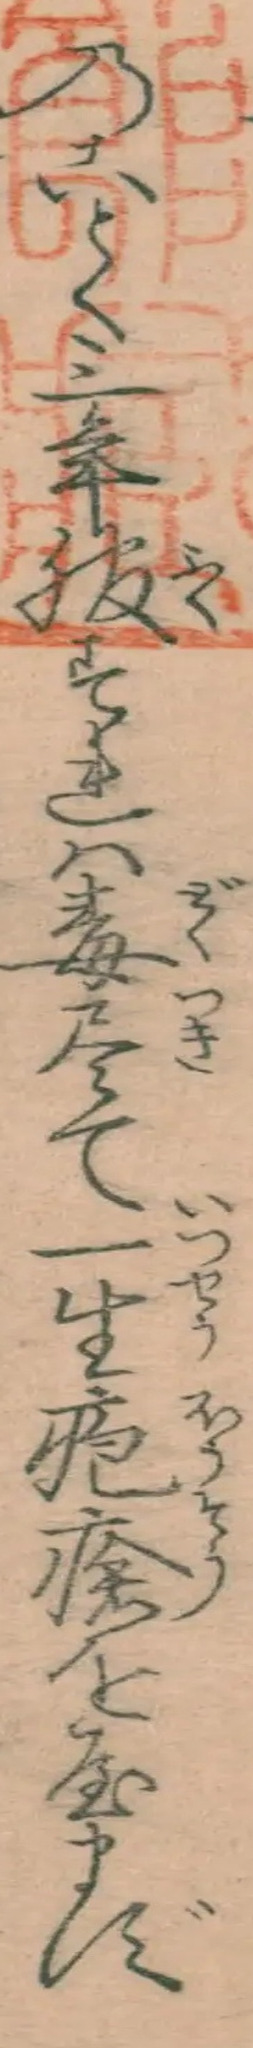のことく三年服すれは毒尽て一生疱瘡をやまず

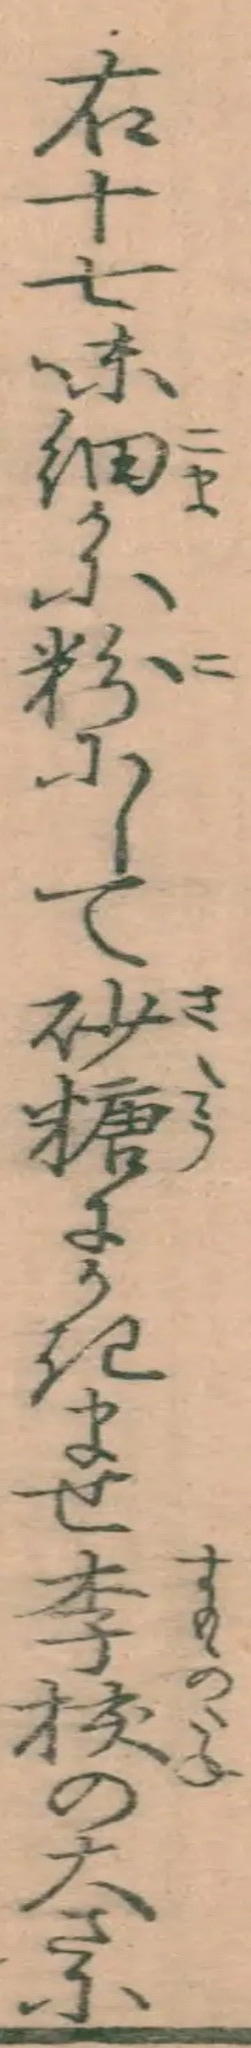右十七味細かに粉にして砂糖にかきませ李核の大さに
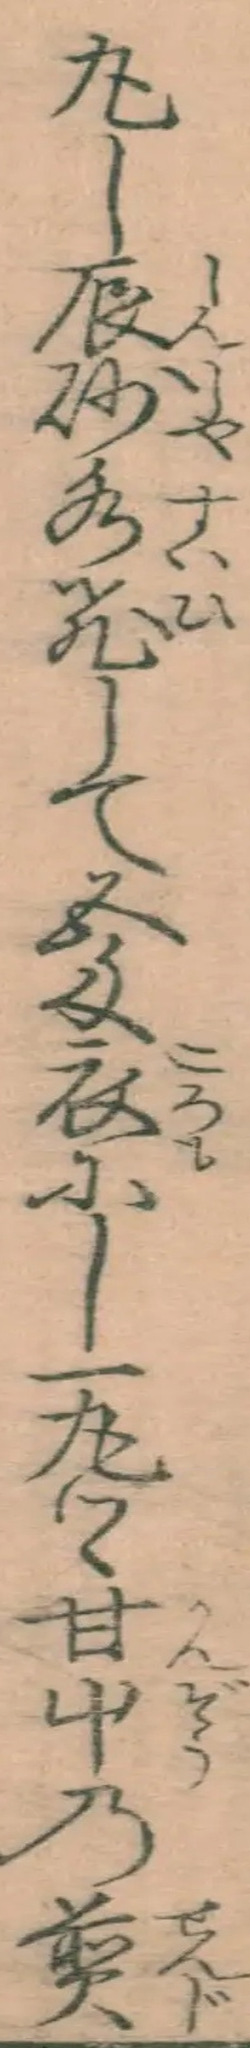丸し辰砂水飛して五匁衣にし一丸つゝ甘屮の煎
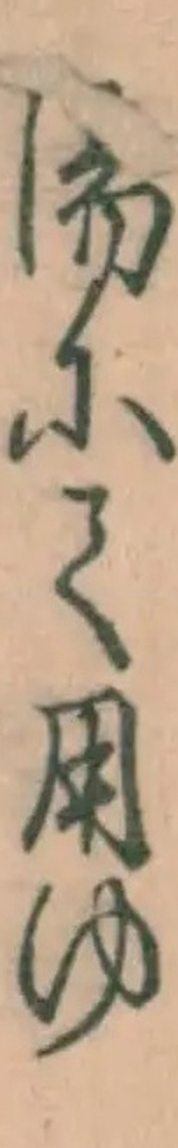湯にて用ゆ
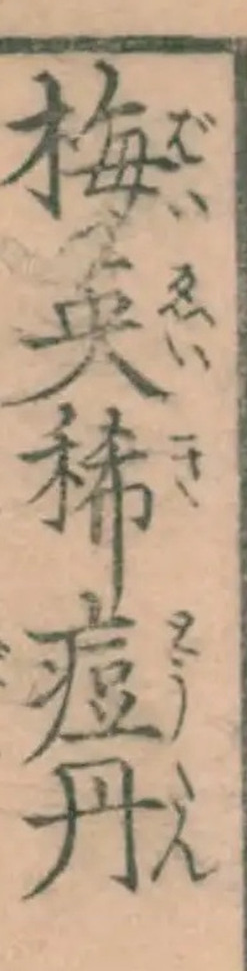梅英稀痘丹
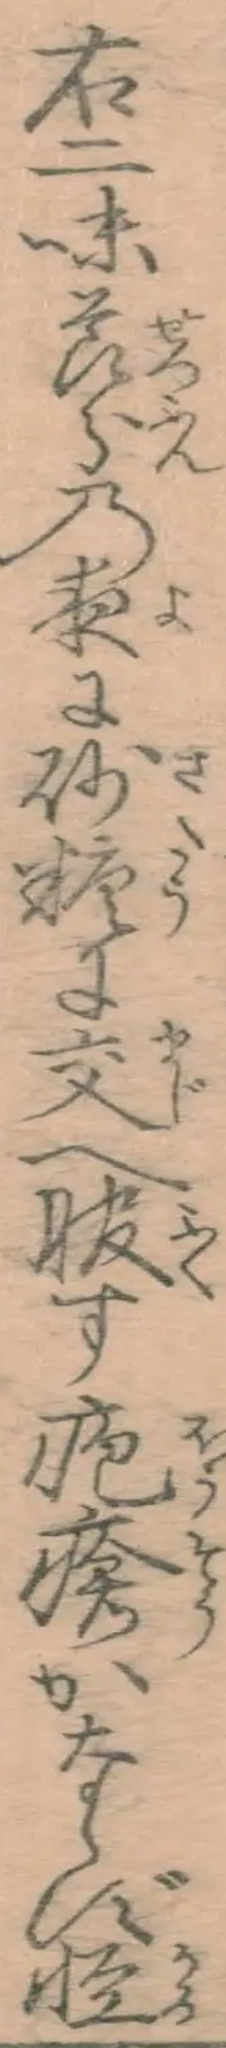右二味節分の夜に砂糖に交へ服す疱瘡かならず軽
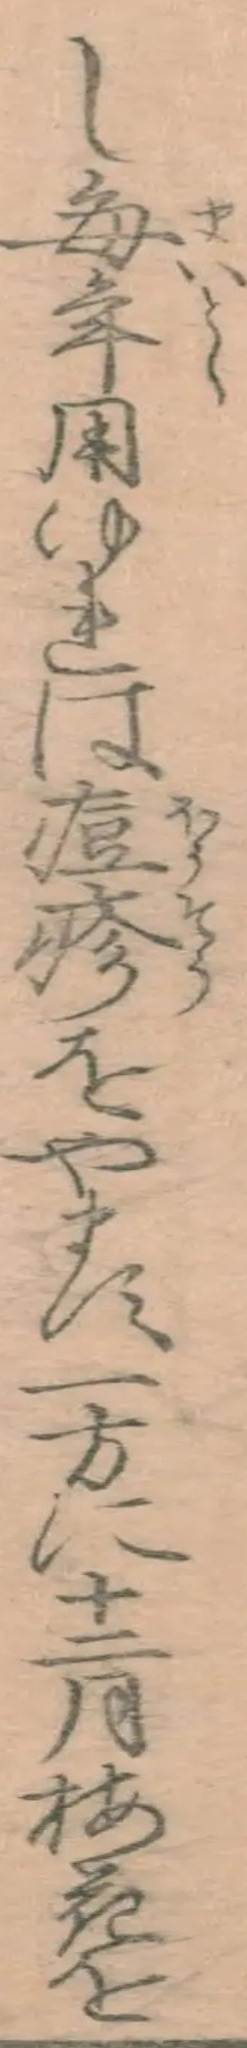し毎年用ゆれは痘疹をやます一方に十二月梅花を
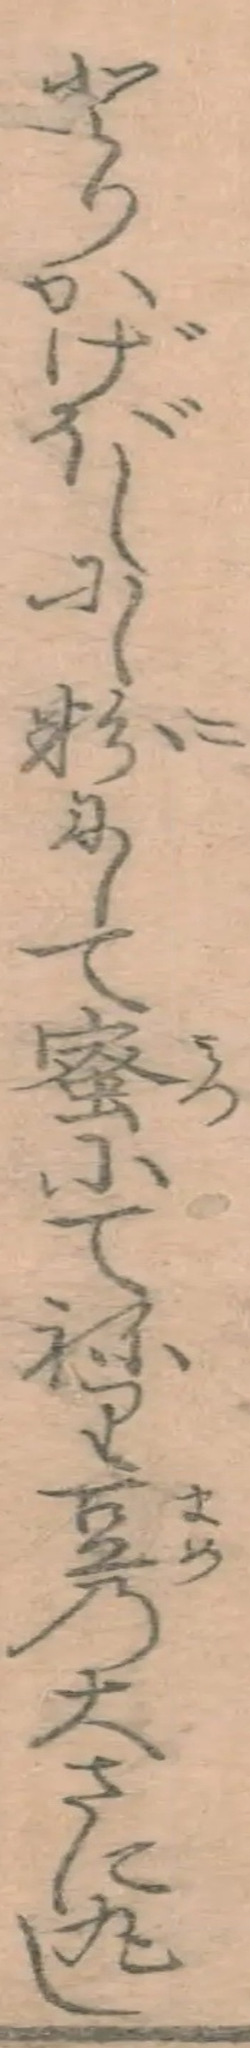とりかげほしにし粉にして蜜にてねり豆の大さに丸し
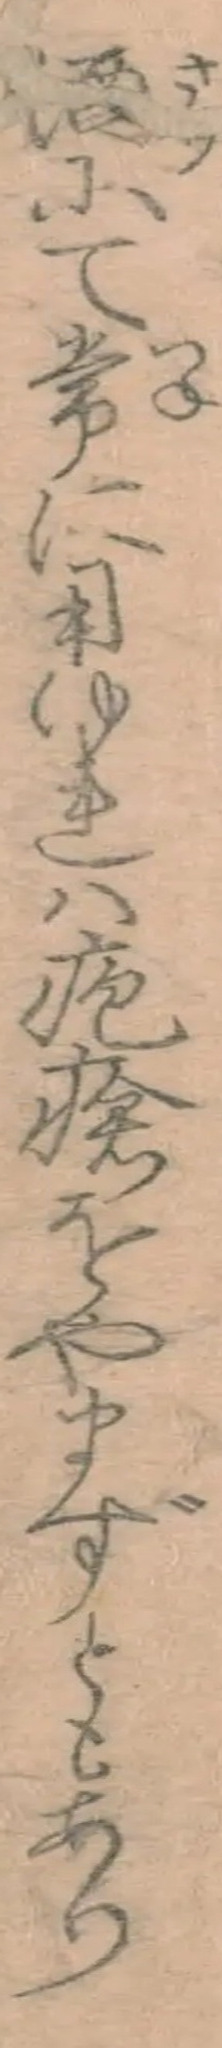酒にて常に用ゆれは疱瘡をやまずともあり
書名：雨夜談
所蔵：国立国会図書館 National Diet Library, JAPAN
